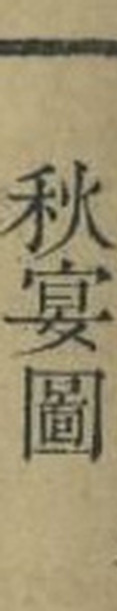秋宴圖

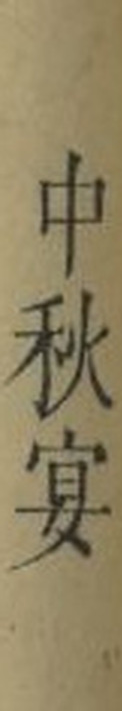中秋宴
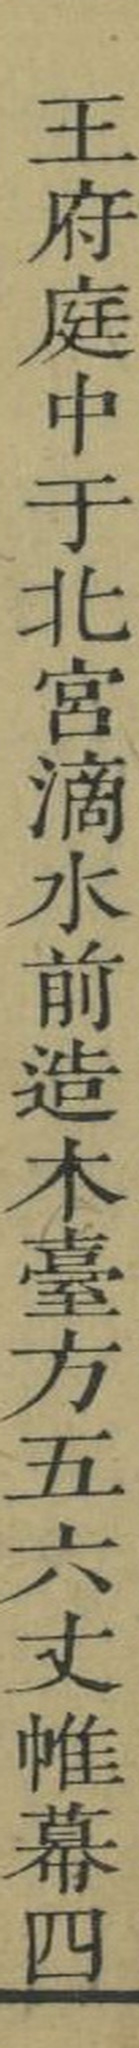王府庭中于北宮滴水前造木臺方五六丈帷幕四
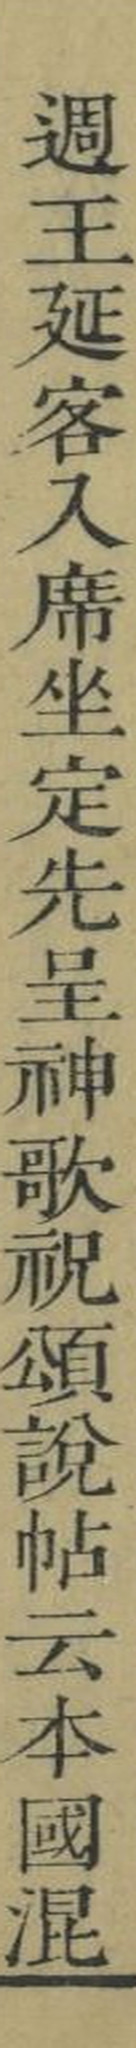週王延客入席坐定先呈神歌祝頌説帖云本國混
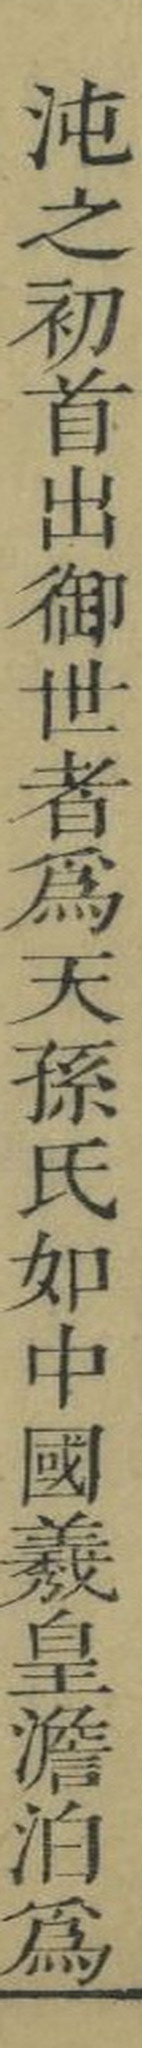沌之初首出御世者爲天孫氏如中國羲皇澹泊爲
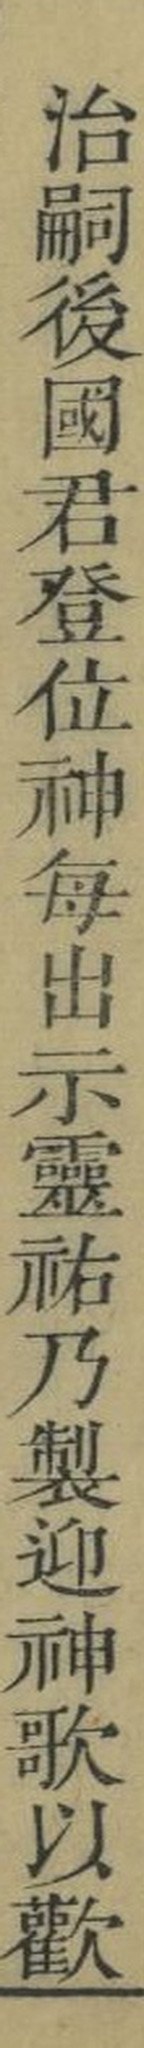治嗣後國君登位神每出示靈祐乃製迎神歌以歡
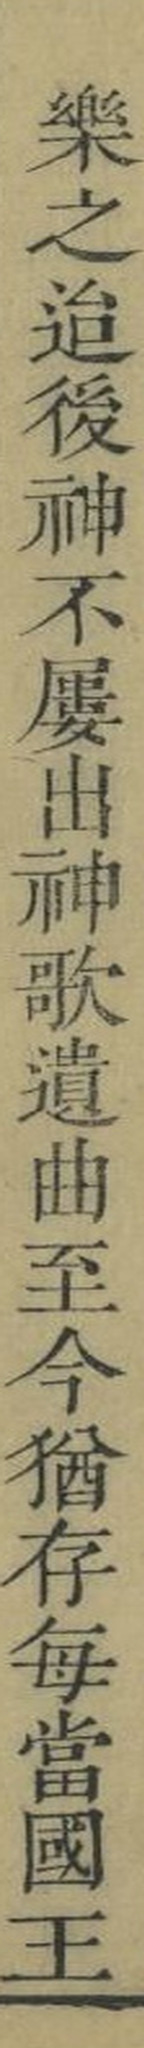樂之迨後神不屢出神歌遺曲至今猶存每當國王
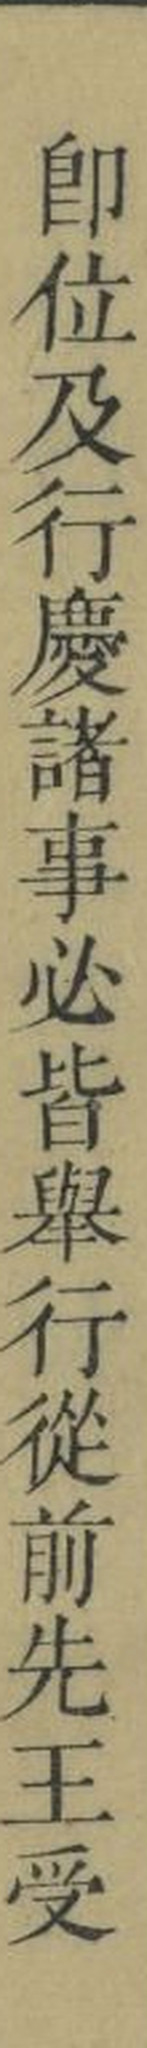卽位及行慶諸事必皆舉行從前先王受
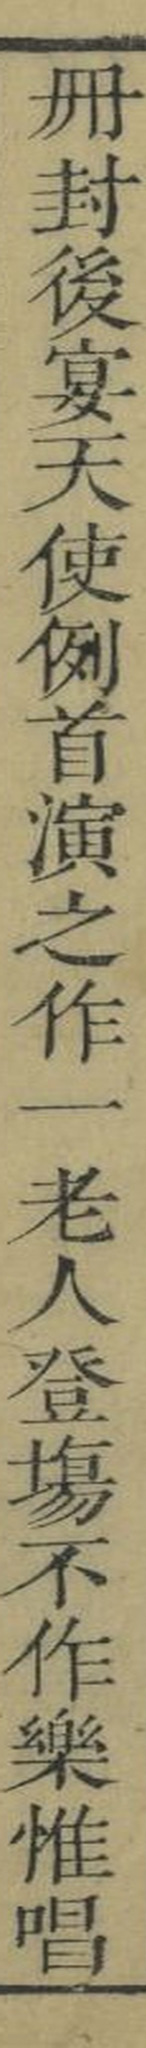冊封後宴天使例首演之作一老人登塲不作樂惟唱
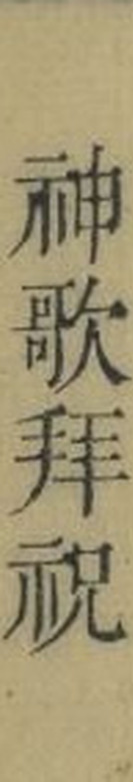神歌拜祝

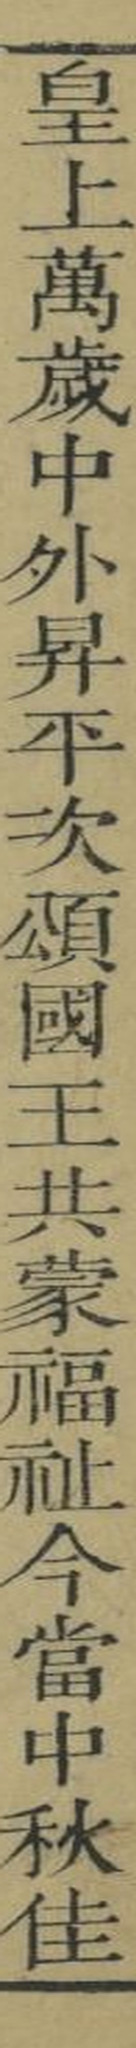皇上萬歲中外昇平次頌國王共蒙福祉今當中秋佳
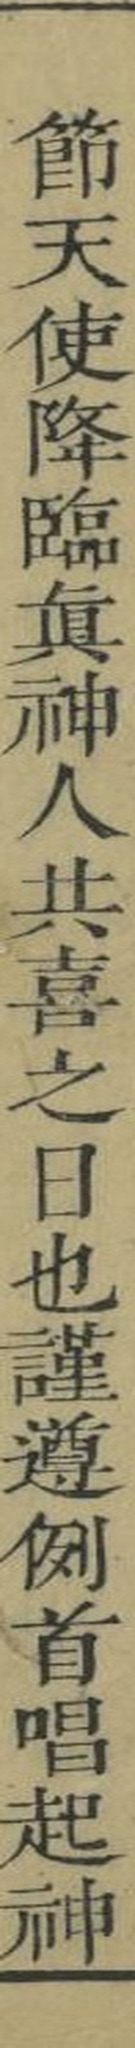節天使降臨眞神人共喜之日也謹遵例首唱起神
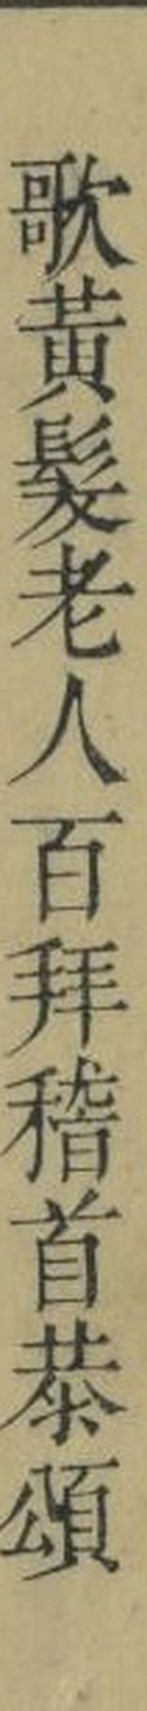歌黃髪老人百拜稽首㳟頌
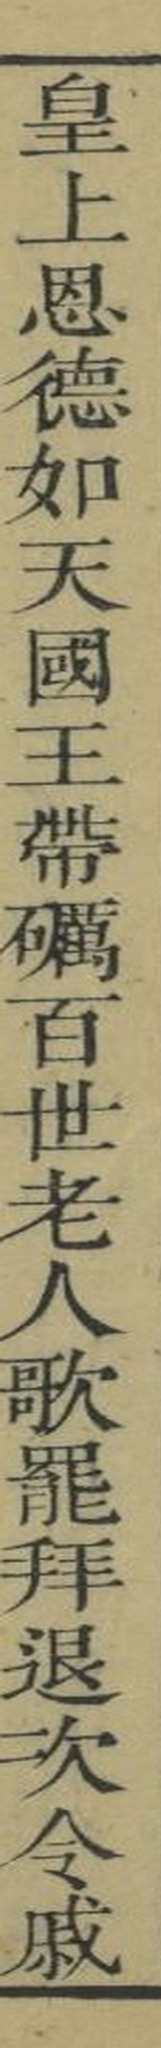皇上恩德如天國王帶礪百世老人歌罷拜退次令戚
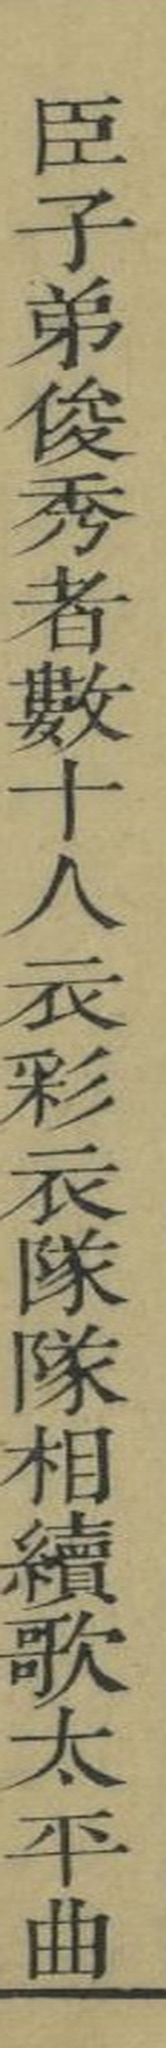臣子弟俊秀者數十人衣彩衣隊隊相續歌太平曲
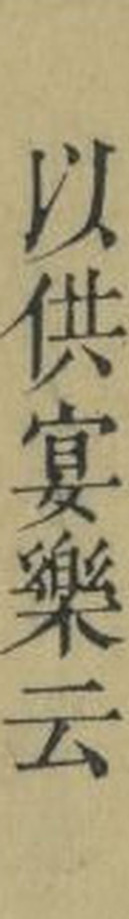以供宴樂云
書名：中山伝信録 巻二
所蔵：University of the Ryukyus Library
